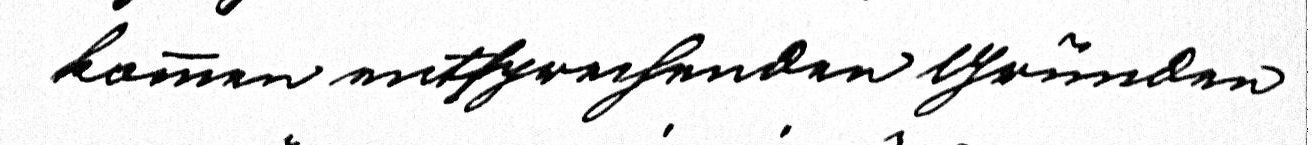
kommen entsprechenden Gründen
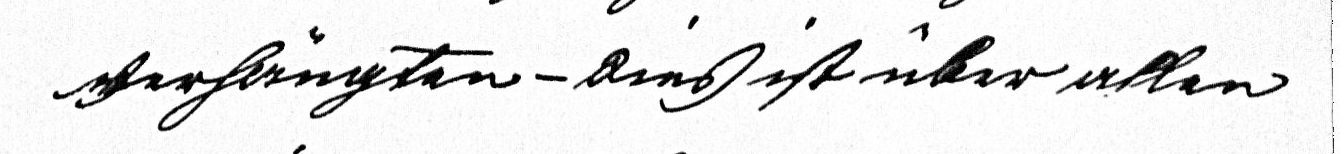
verhängten - dies ist über allen
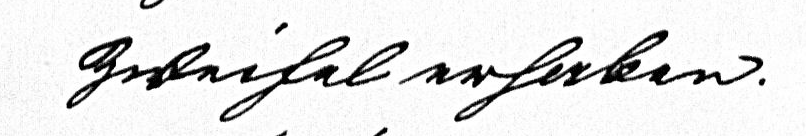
Zweifel erhaben.
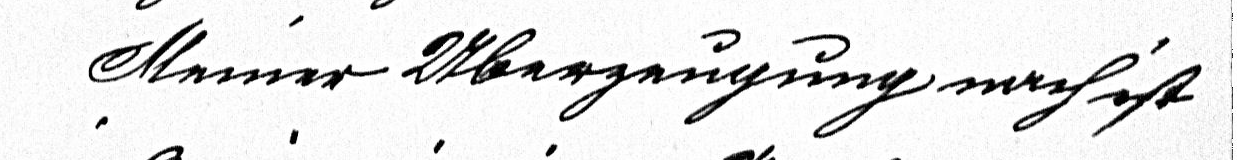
Meiner Uberzeugung nach ist
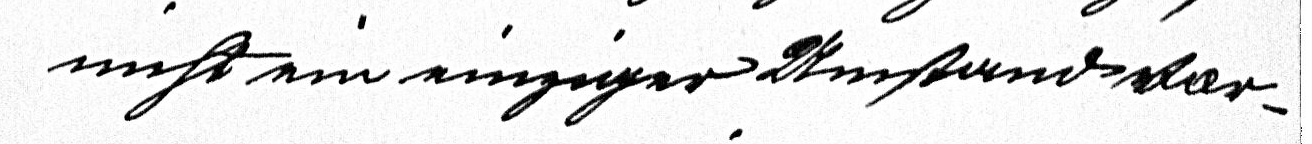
nicht ein einziger Umstand vor¬
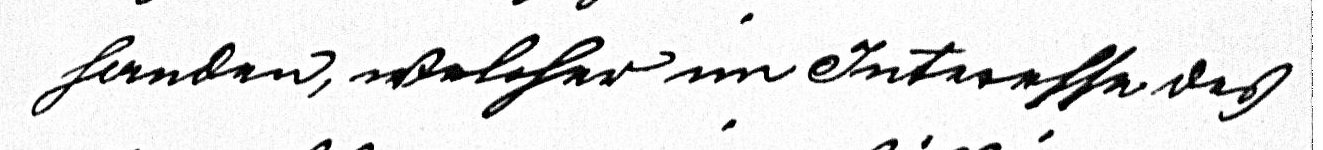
handen, welcher im Interesse des
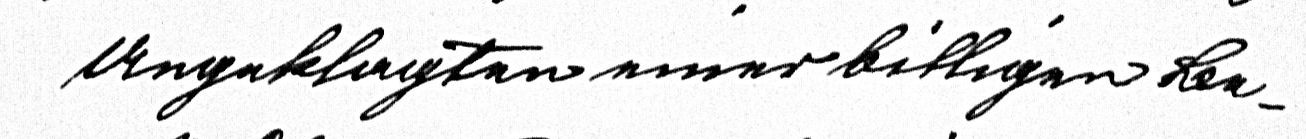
Angeklagten einer billigen Be¬
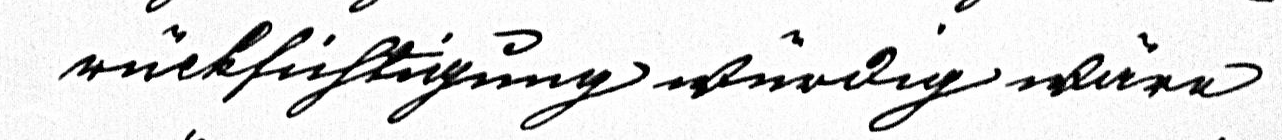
rücksichtigung würdig wäre
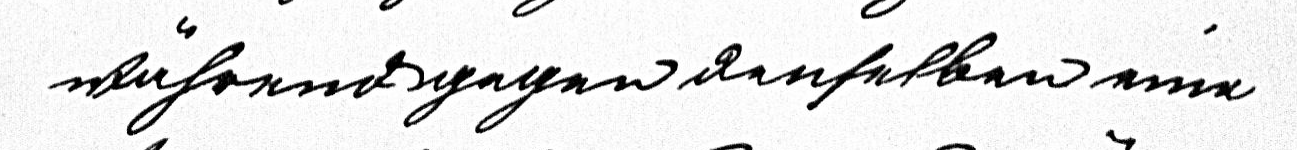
während gegen denselben eine
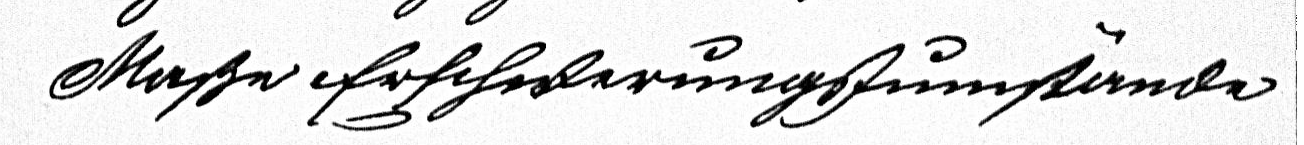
Maße Erschwerungsumstände
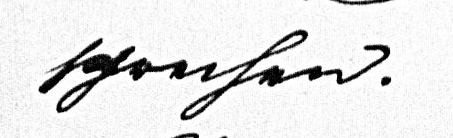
sprechen.
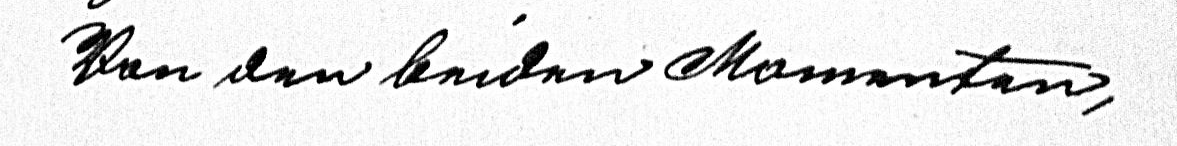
Von den beiden Momenten,
